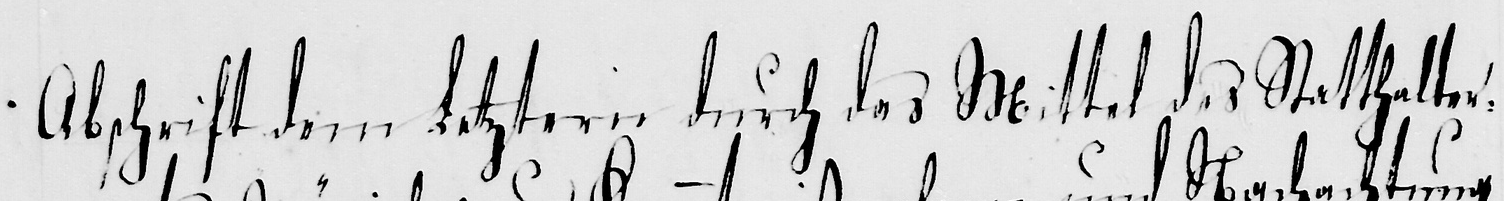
Abschrift dem Letztern durch das Mittel des Statthalte¬
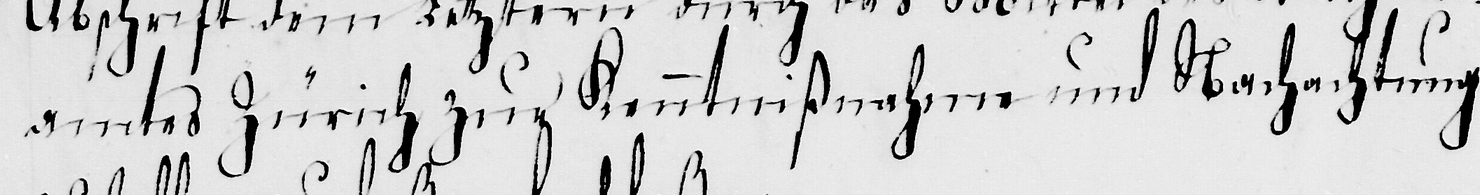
ramtes Zürich zur Kenntnißnahme und Nachachtung
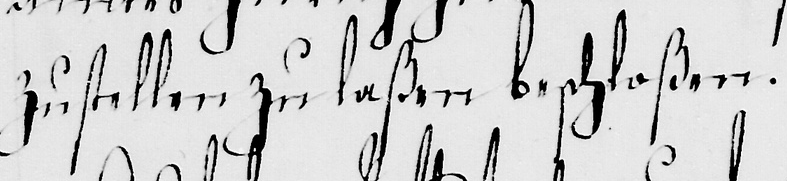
zustellen zu laßen beschloßen.
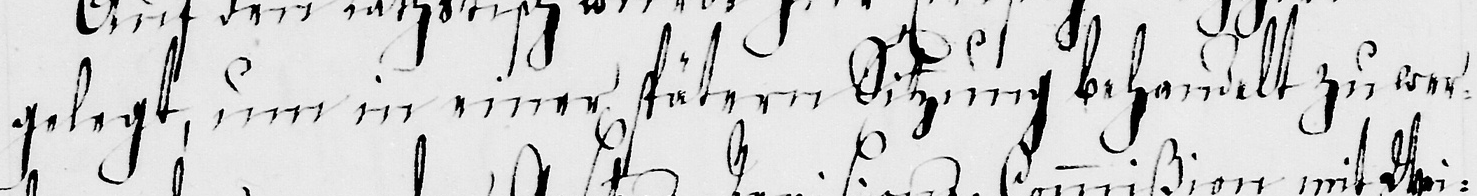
gelegt, um in einer spätern Sitzung behandelt zu wer¬
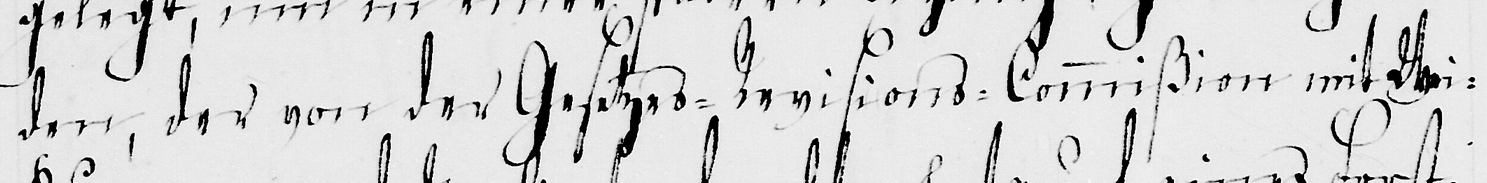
den, der von der Gesetzes-Revisions-Commißion mit Wei¬
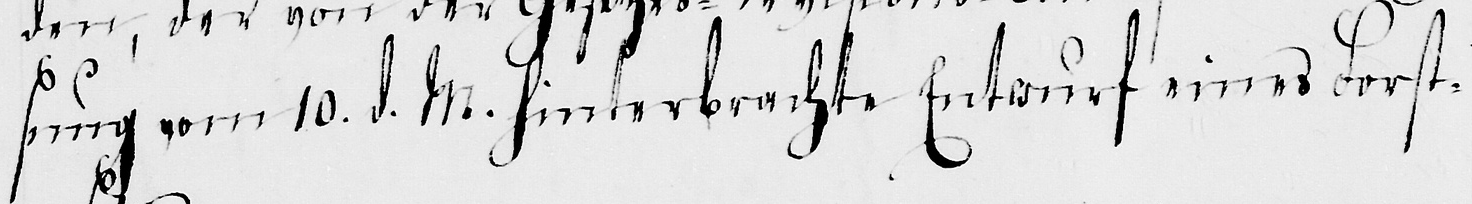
sung vom 10. d. M. hinterbrachte Entwurf eines Forst¬
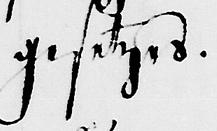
gesetzes.
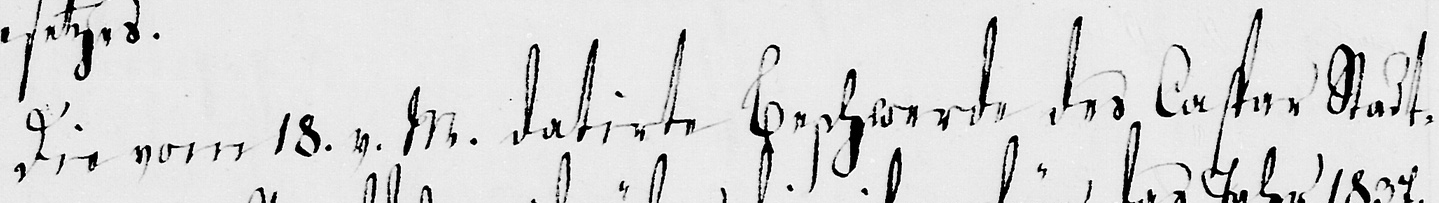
Die vom 18. v. M. datirte Beschwerde des Caspar Stadt¬
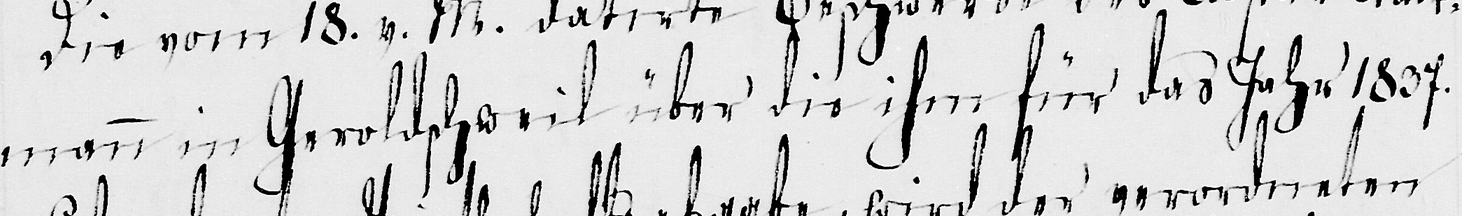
mann in Geroldschweil über die ihm für das Jahr 1837.
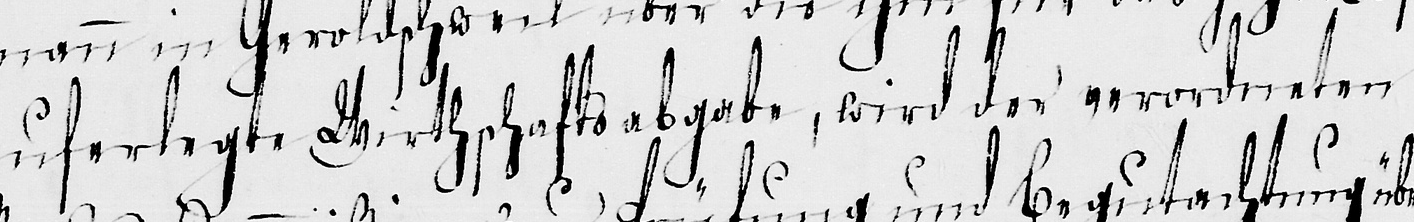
auferlegte Wirthschaftsabgabe, wird der verordneten
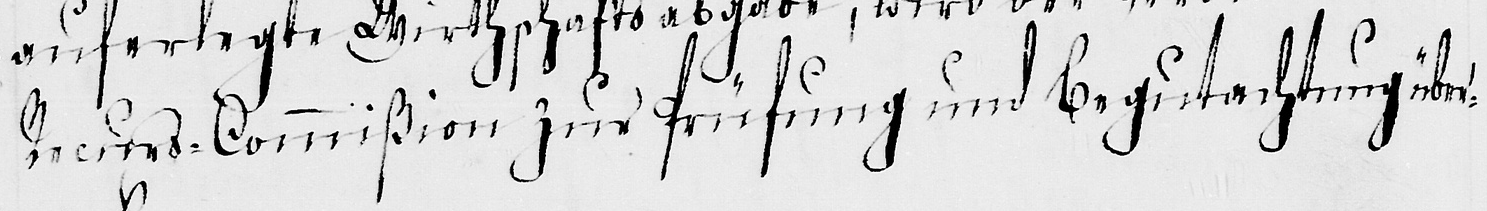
Recurs-Commißion zur Prüfung und Begutachtung übe¬
